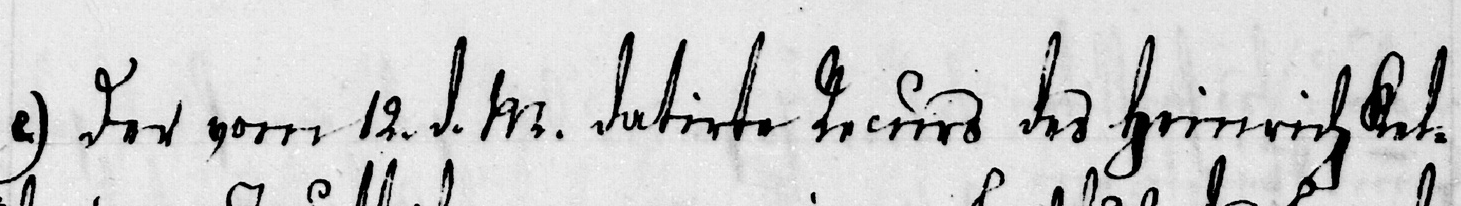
e.) Der vom 12. d. M. datirte Recurs des Heinrich Kel¬
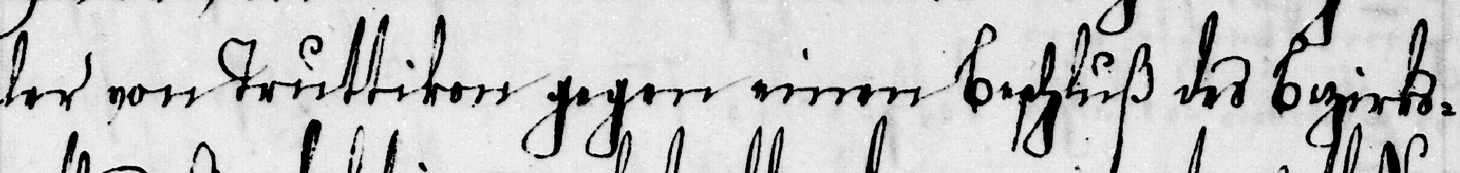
ler von Truttikon gegen einen Beschluß des Bezirks¬
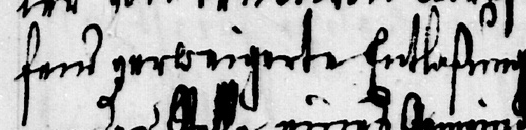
fend verweigerte Entlaßung
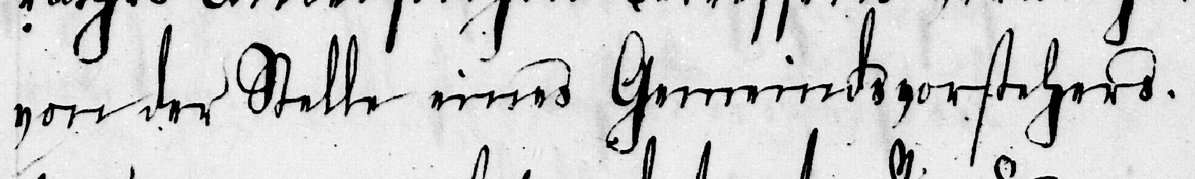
von der Stelle eines Gemeindsvorstehers.
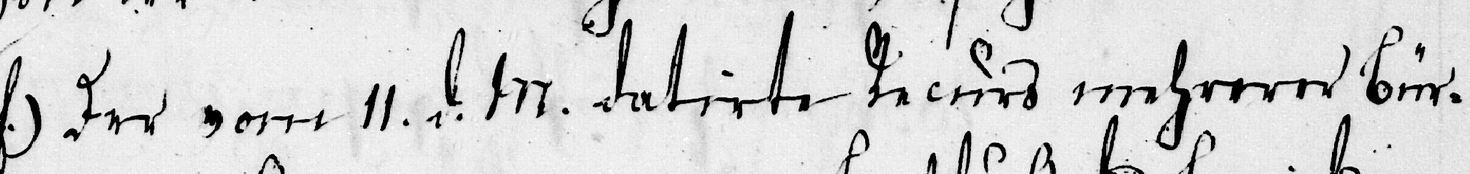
f.) Der vom 11. d. M. datirte Recurs mehrerer Bür¬
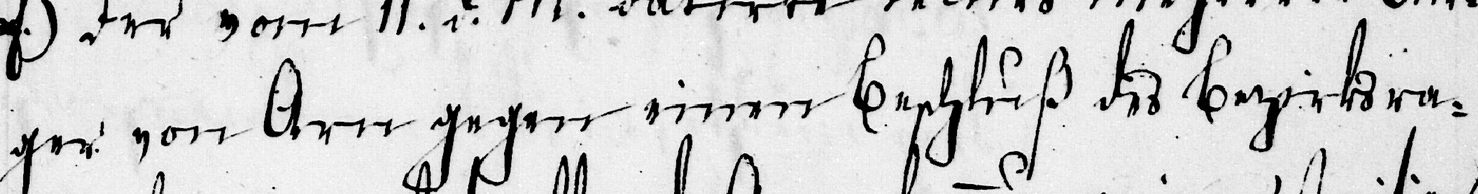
ger von Arn gegen einen Beschluß des Bezirksra¬
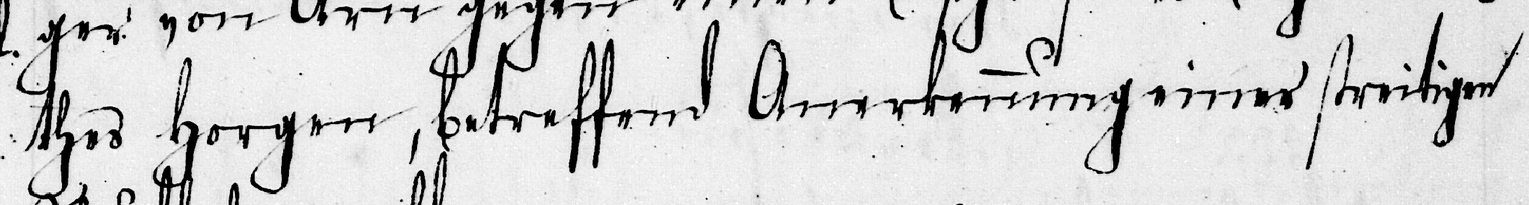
thes Horgen, betreffend Anerkennung einer streitigen
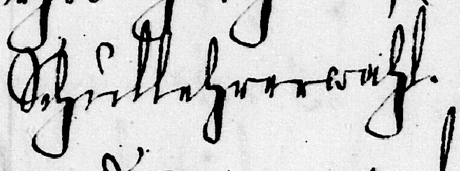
Schullehrerwahl.
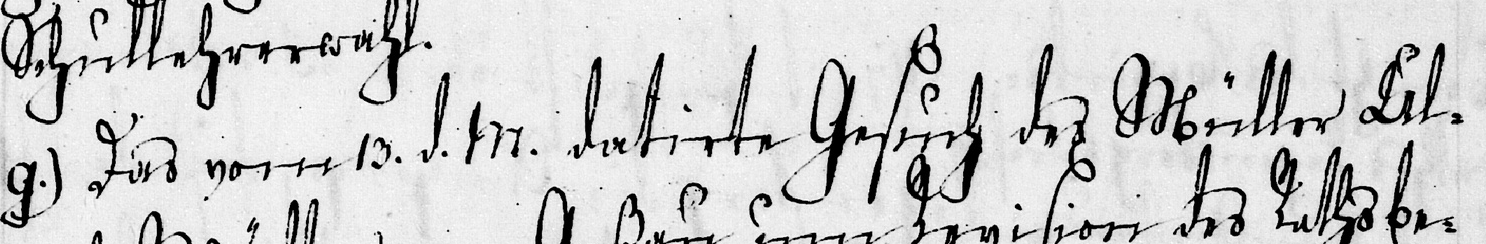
g.) Das vom 13. d. M. datirte Gesuch des Müller Ul¬
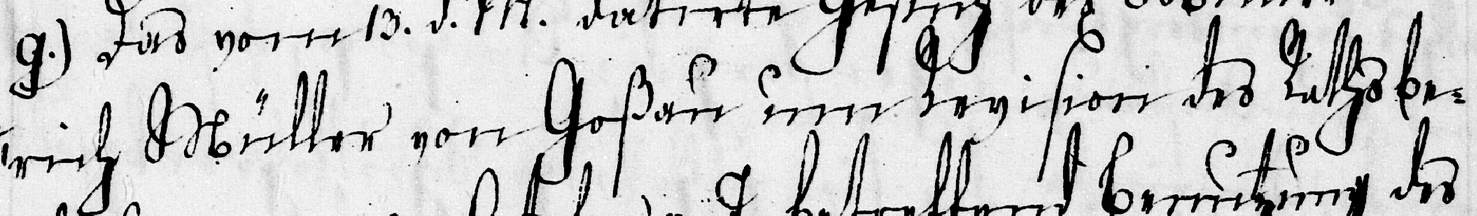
rich Müller von Goßau um Revision des Rathsbe¬
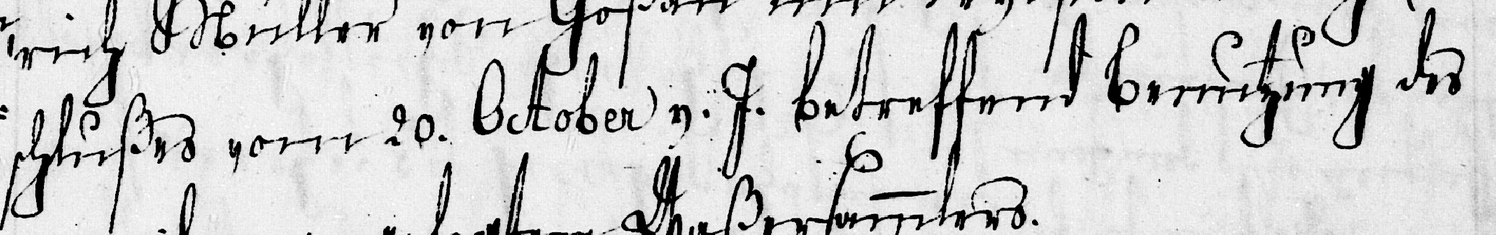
schlußes vom 20. October v. J. betreffend Benutzung des
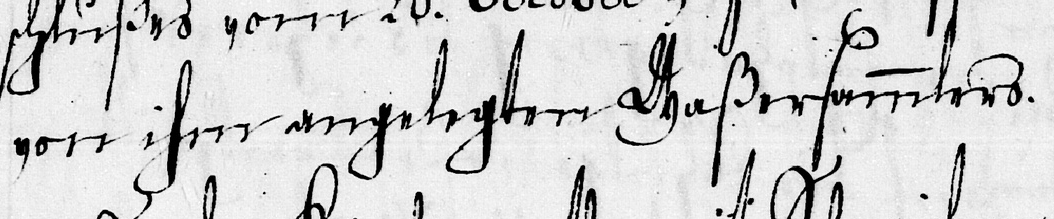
von ihm angelegten Waßersammlers.
